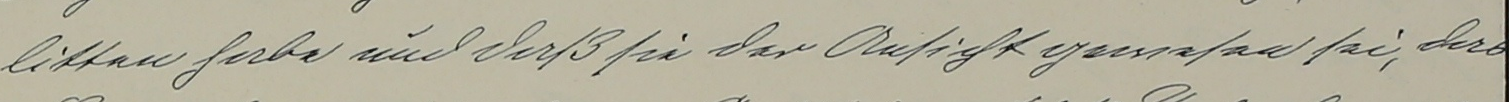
litten habe und daß sie der Ansicht gewesen sei, das
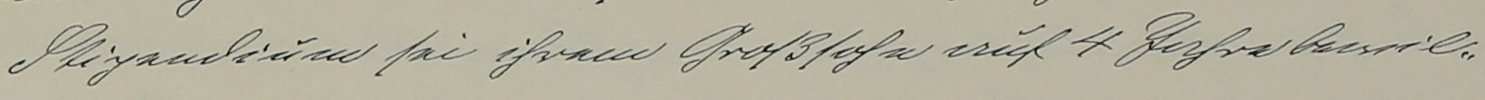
Stipendium sei ihrem Großsohn auf 4 Jahre bewil-
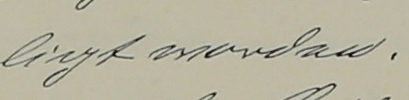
ligt worden.
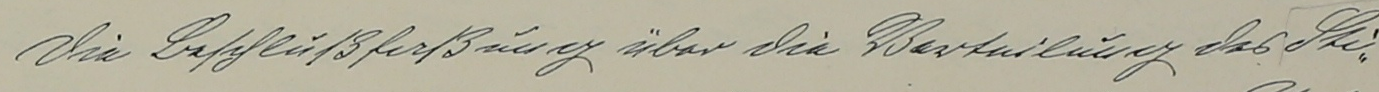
Die Beschlußfaßung über die Verteilung des Sti-
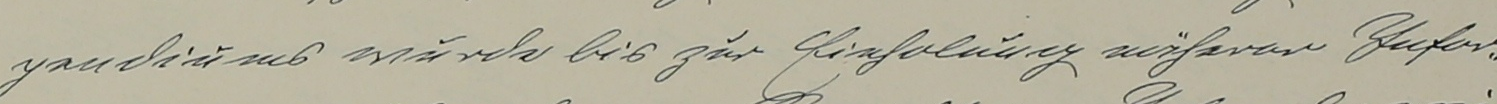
pendiums wurde bis zur Einholung näherer Infor-
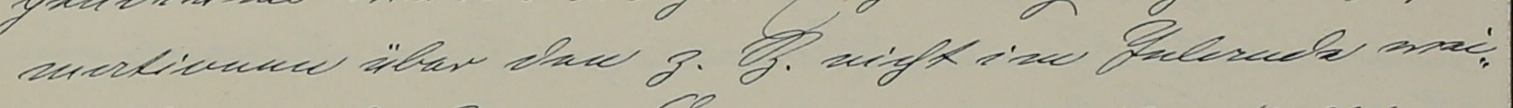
mationen über den z.Z. nicht im Inlande wei-
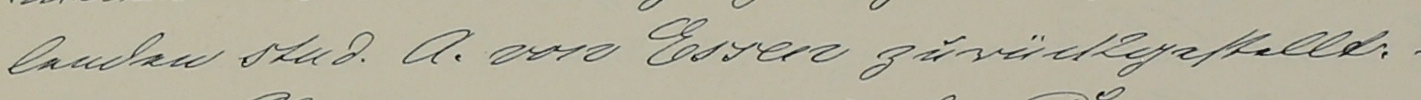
lenden stud. A. von Essen zurückgestellt.
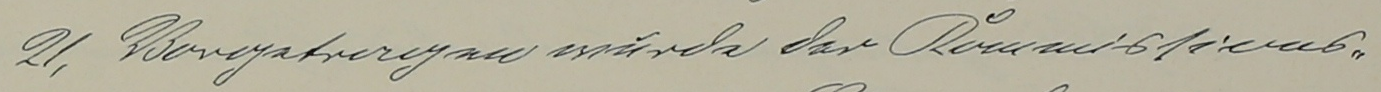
21. Vorgetragen wurde der Kommissions-
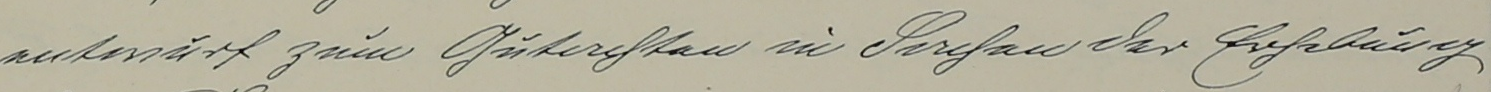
entwurf zum Gutachten in Sachen der Erhebung
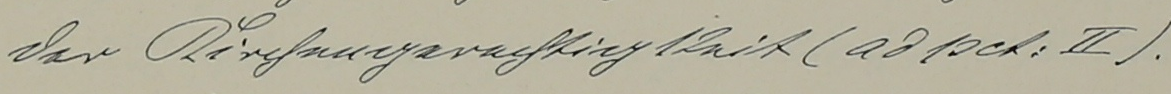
der Kirchengerechtigkeit (ad pct. II).
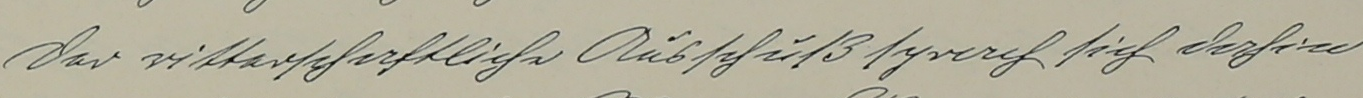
Der ritterschaftliche Ausschuß sprach sich dahin
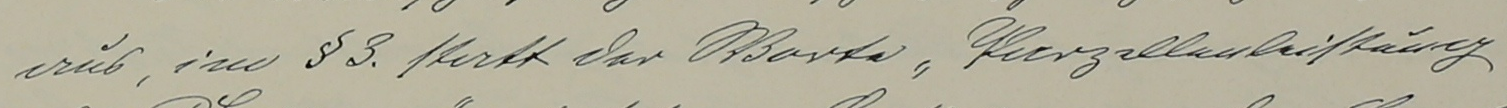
aus, im § 3. statt der Worte „Parzellenleistung
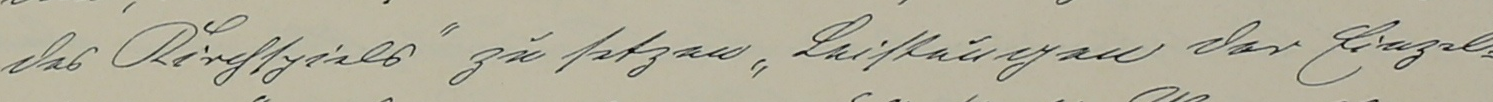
des Kirchspiels“ zu setzen „Leistungen der Einzel-
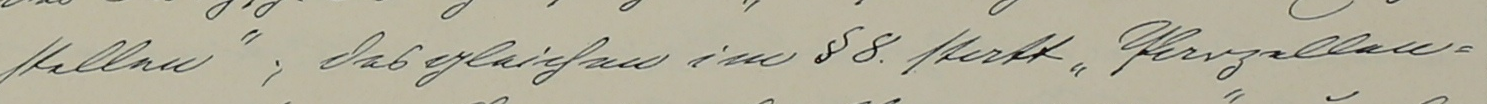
stellen“; desgleichen im § 8. statt „Parzellen-
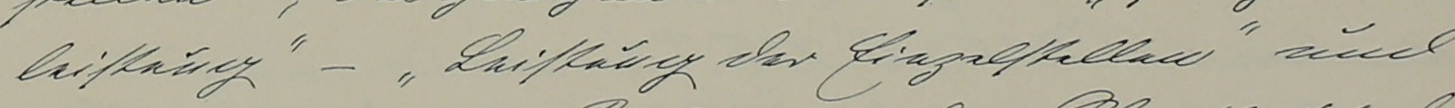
leistung“ – „Leistung der Einzelstellen“ und
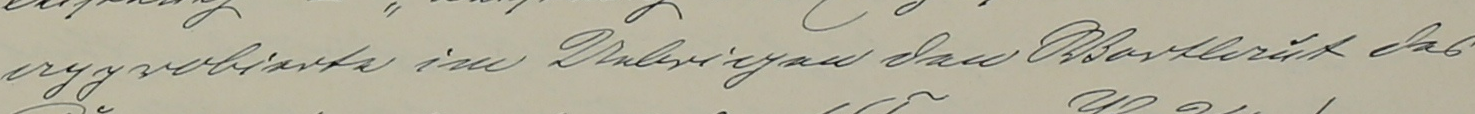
approbierte im Uebrigen den Wortlaut des
